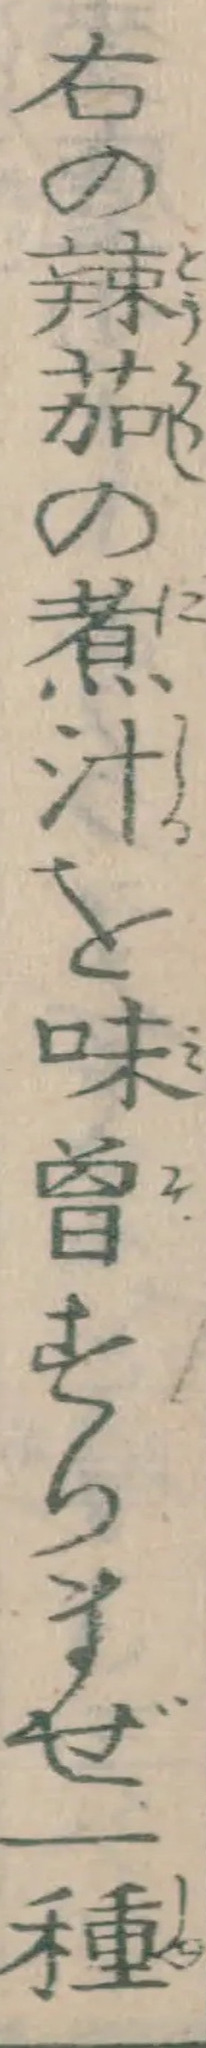右の辣茄の煮汁を未曽すりまぜ一種
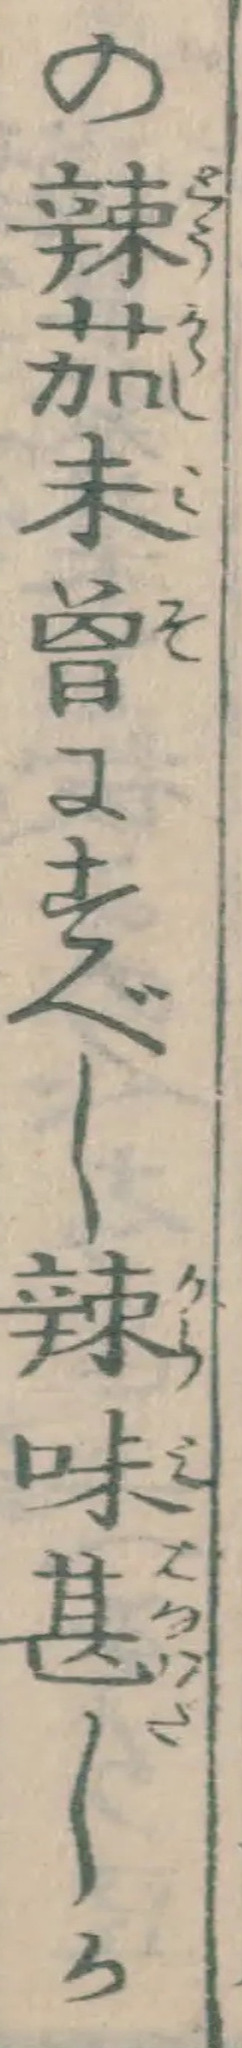の辣茄未曽にすべし辣味甚しか
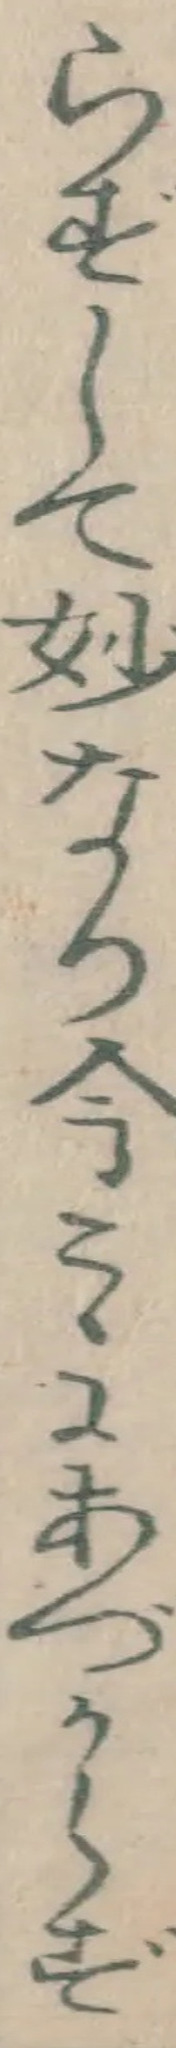らずして妙なり今こゝにあづからず
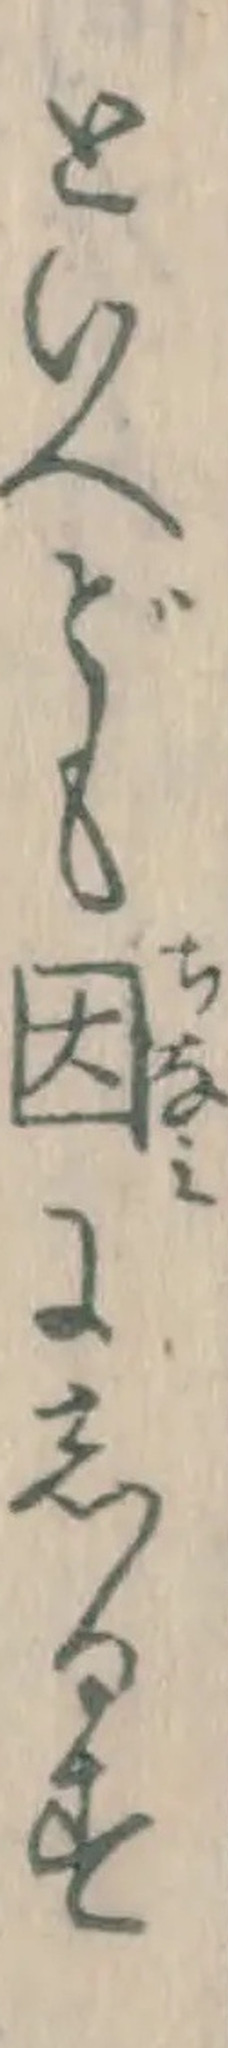といへども因にしるす
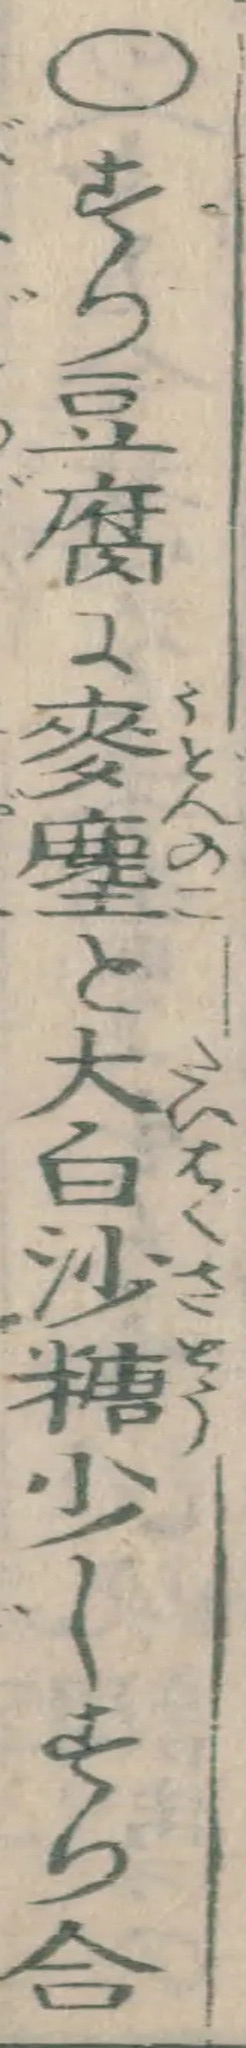○すり豆腐に麦塵と大白沙糖少しすり合
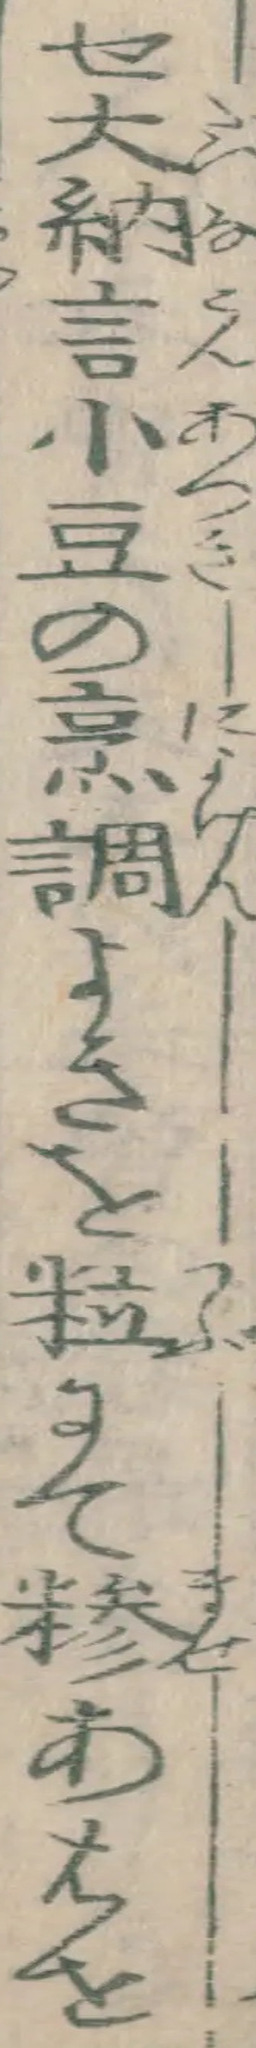せ大納言小豆の烹調よきを粒にて糝あはせ
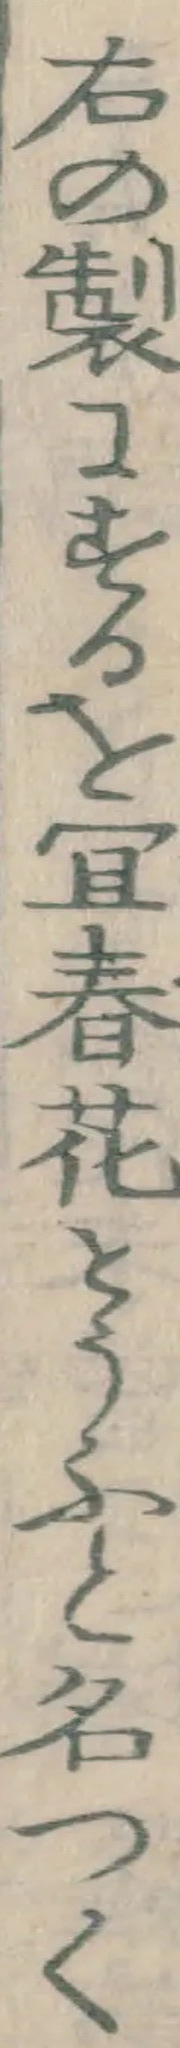右の製にするを宜春花とうふと名つく
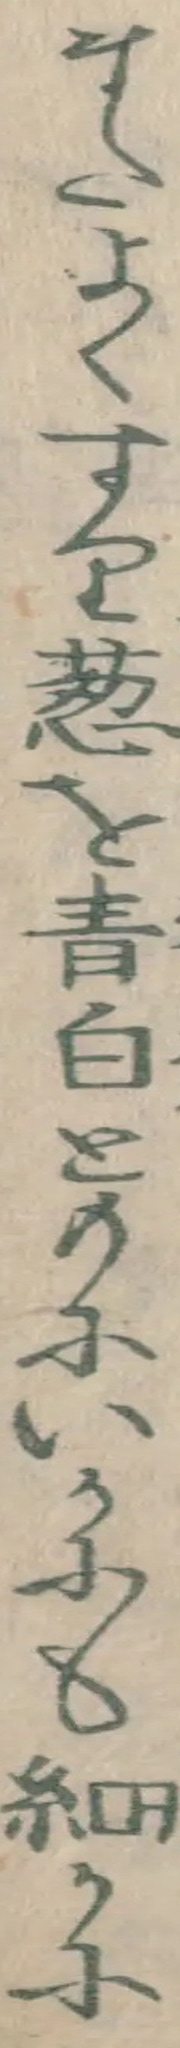またよくすり葱を青白ともにいかにも細かに

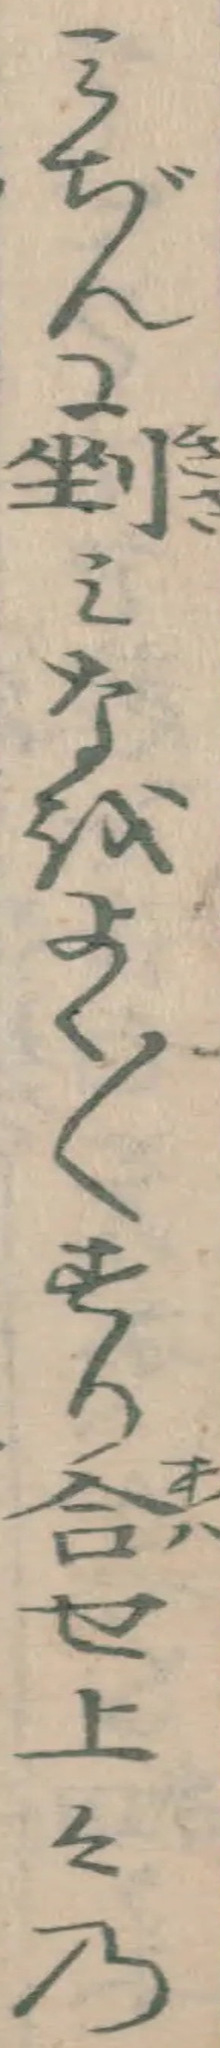みぢんに剉みなをよく〳〵すり合せ上々の
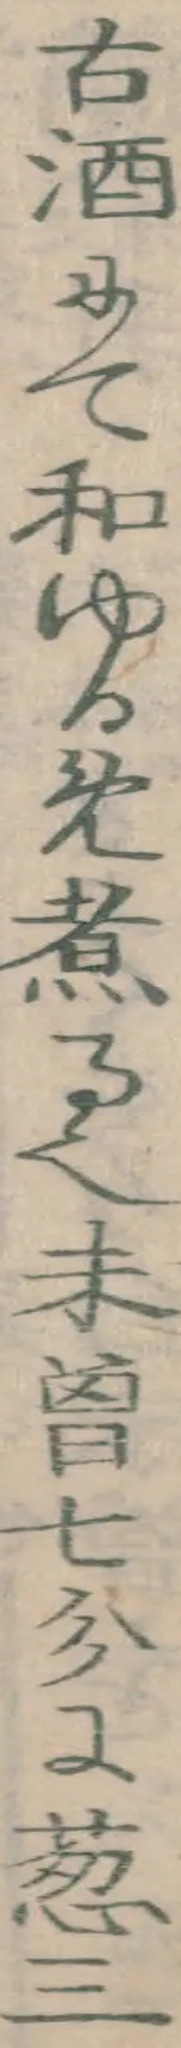古酒にて和ゆるめ煮る也未曽七分に葱三
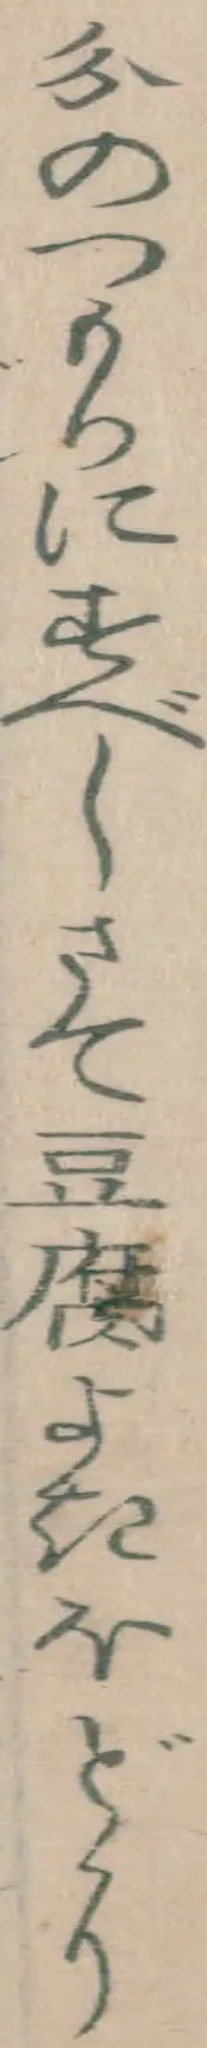分のつもりにすべしさて豆腐よきほどに
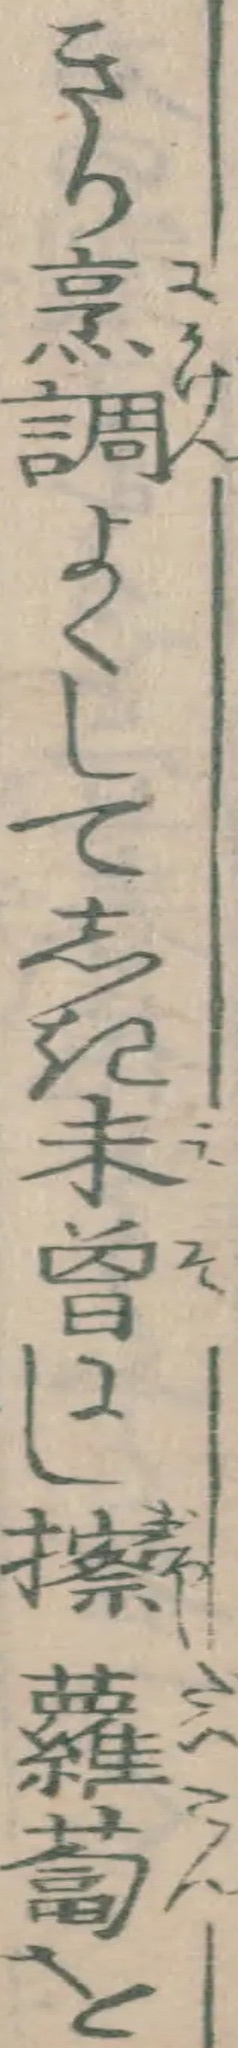きり烹調よくしてしき未曽にし擦蘿蔔を
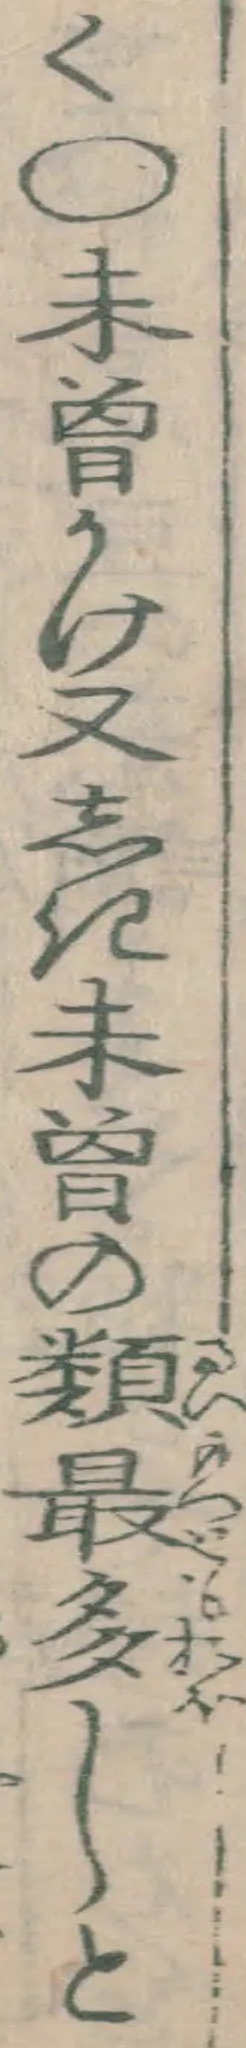く○未曽かけ又しき未曽の類最多しと
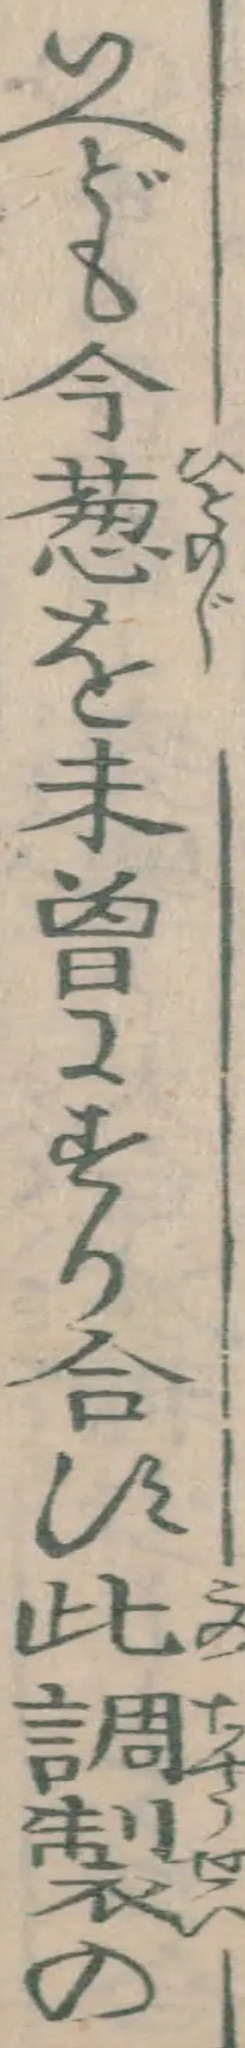いへども今葱を未曽にすり合す此調製の
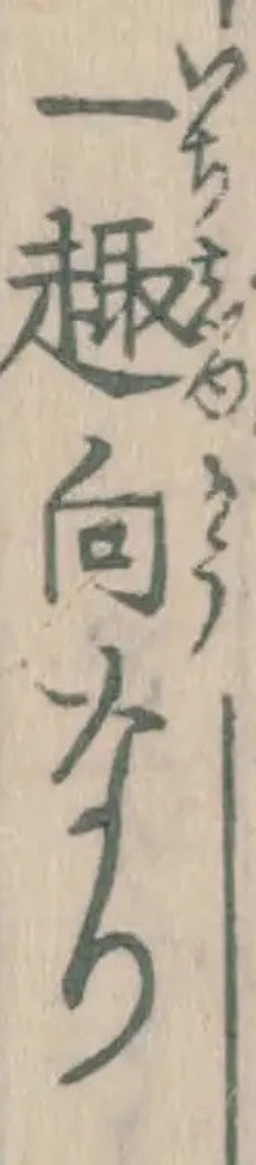一趣向なり
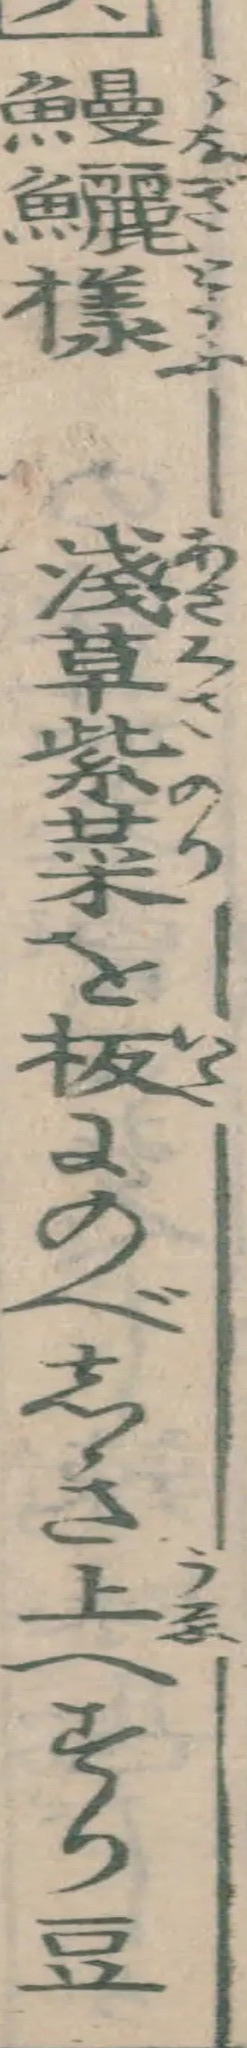七十六鰻鱺様浅草紫菜を板にのべしき上へすり豆
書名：豆腐百珍. 続編
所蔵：国立国会図書館 National Diet Library, JAPAN
